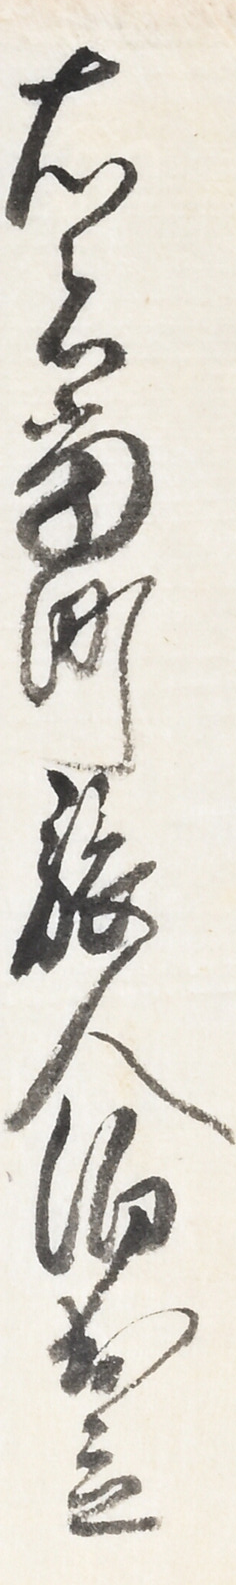右者当町旅人泊出立
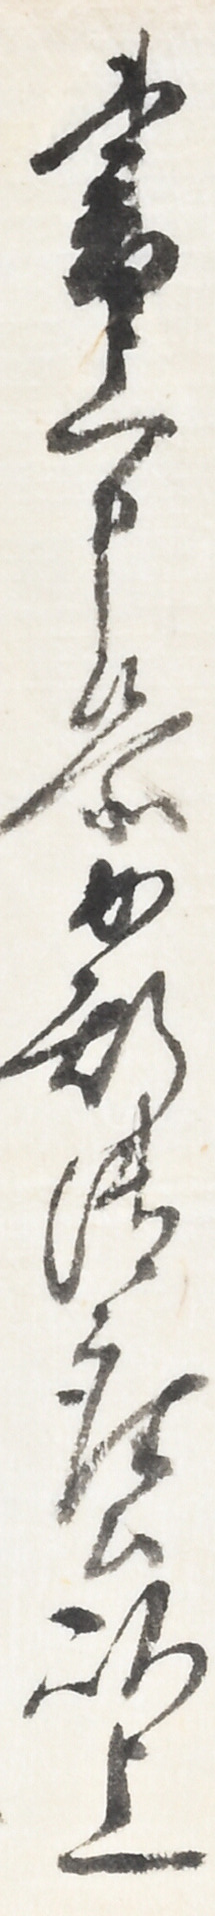書上申候所如斯御座候以上
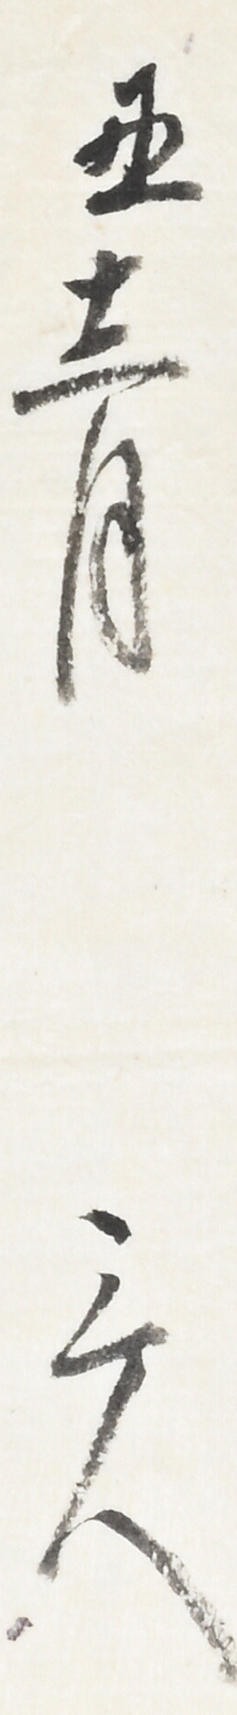丑十二月三人
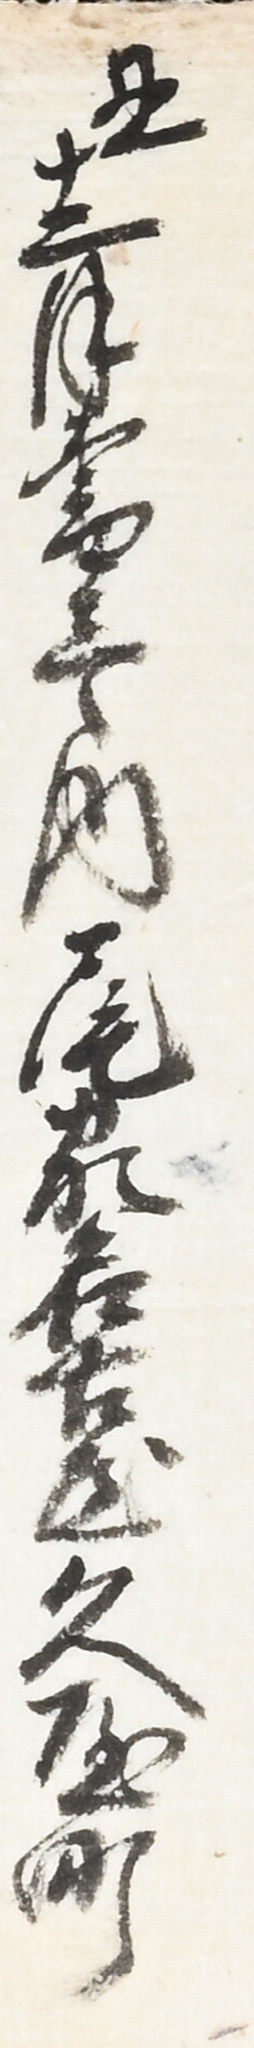丑十二月書上之内尾州名古屋久屋町
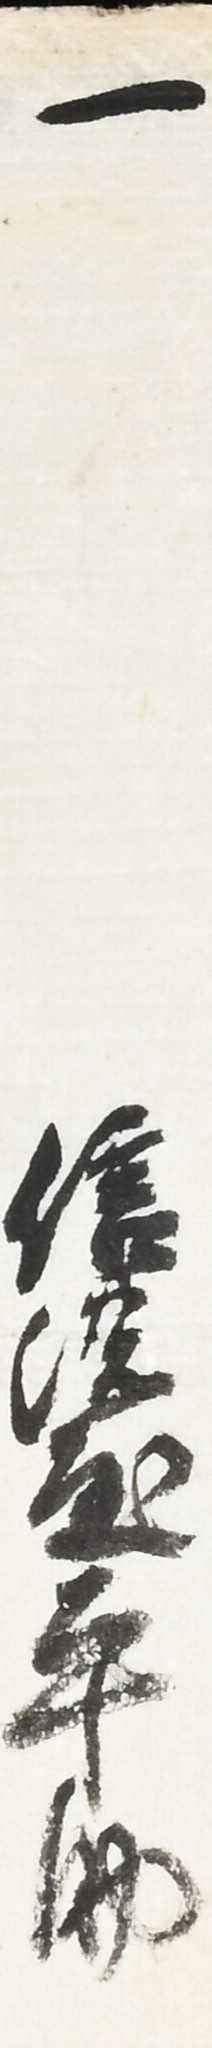一信濃屋平助
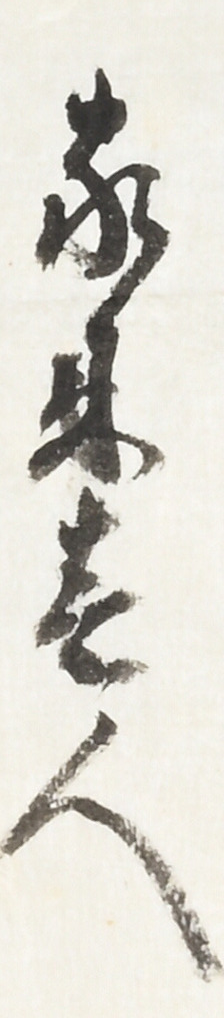家来壱人
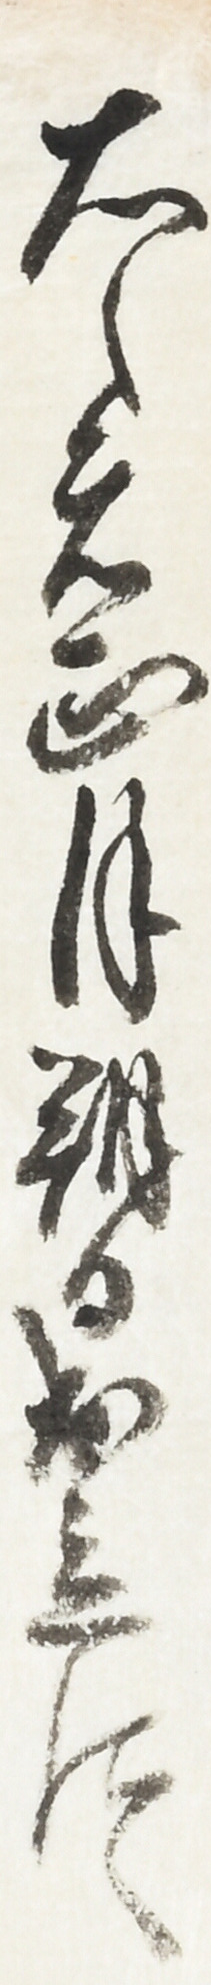右之者正月朔日出立仕候
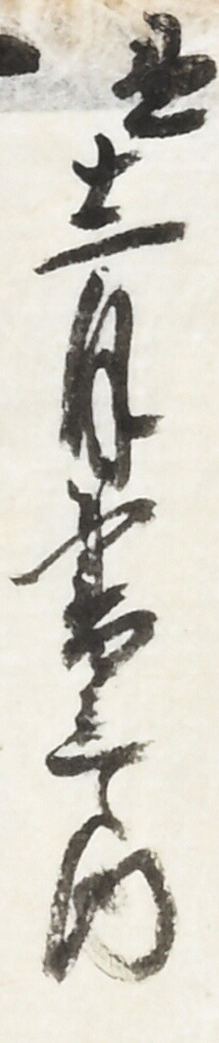丑十二月三人
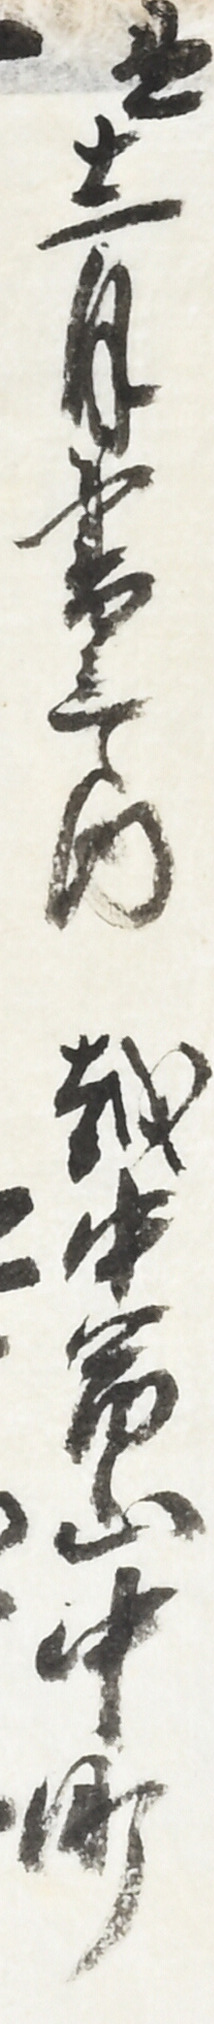丑十二月書上之内越中冨山中町
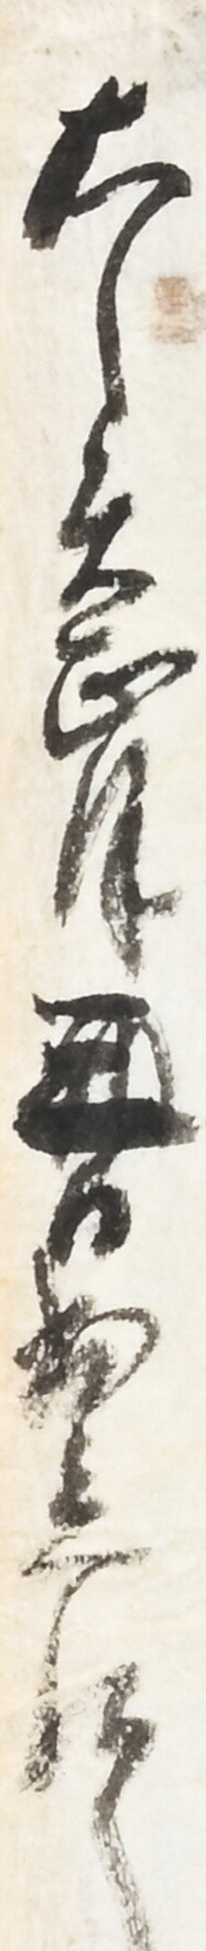右之者正月朔日出立仕候

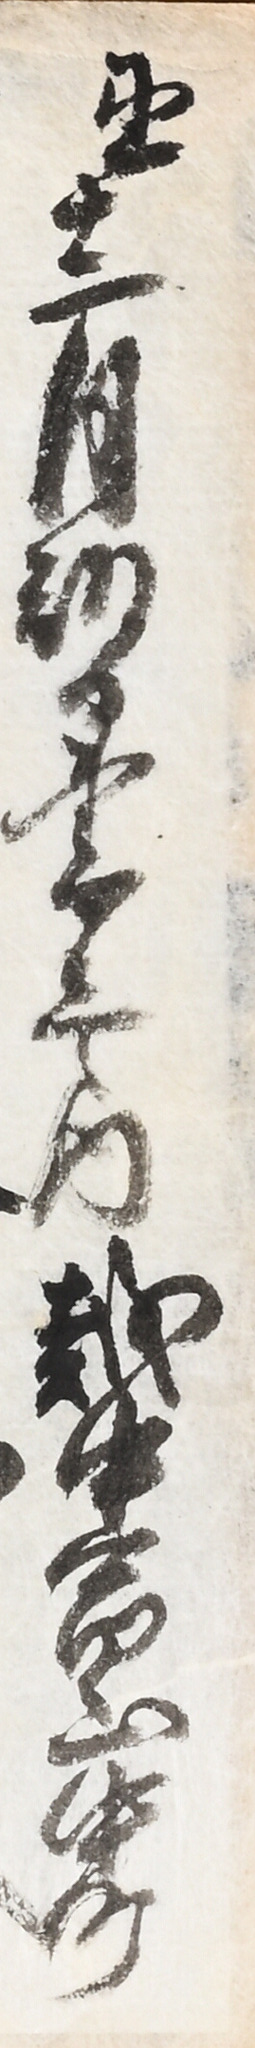丑十二月朔日書上之内越中冨山中町
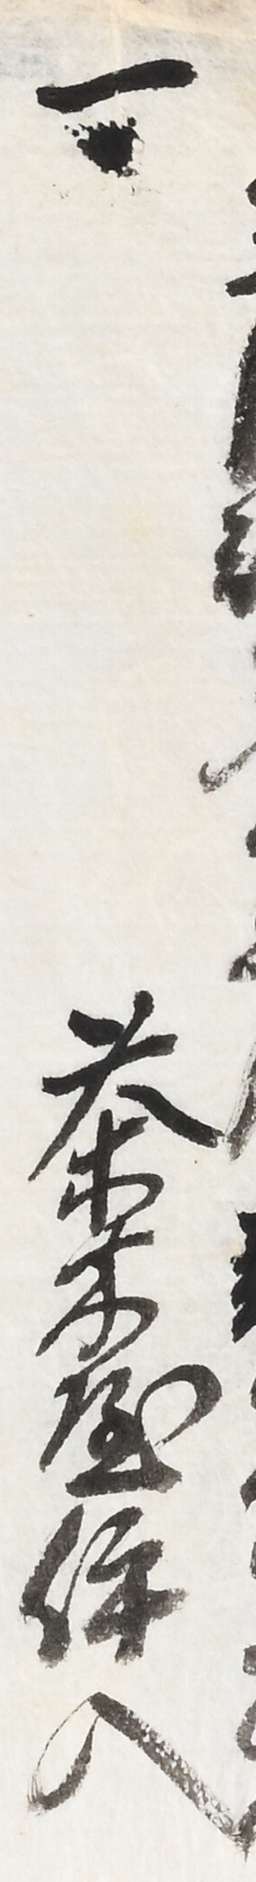一茶木屋伊八
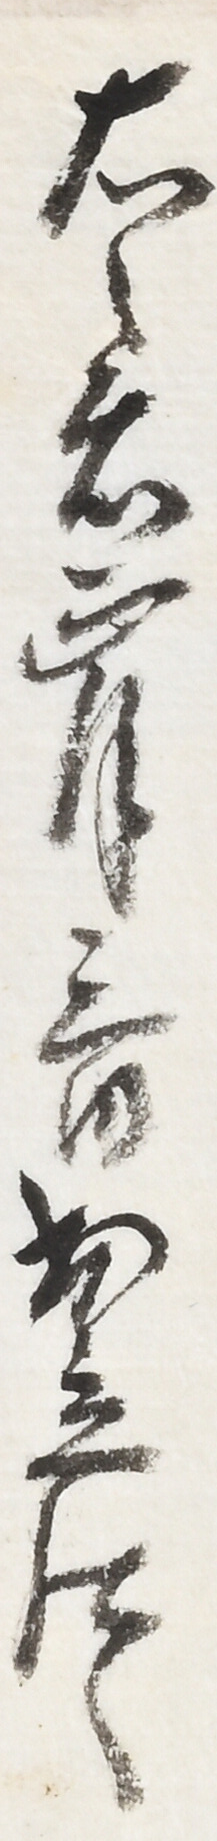右之者正月三日出立仕候
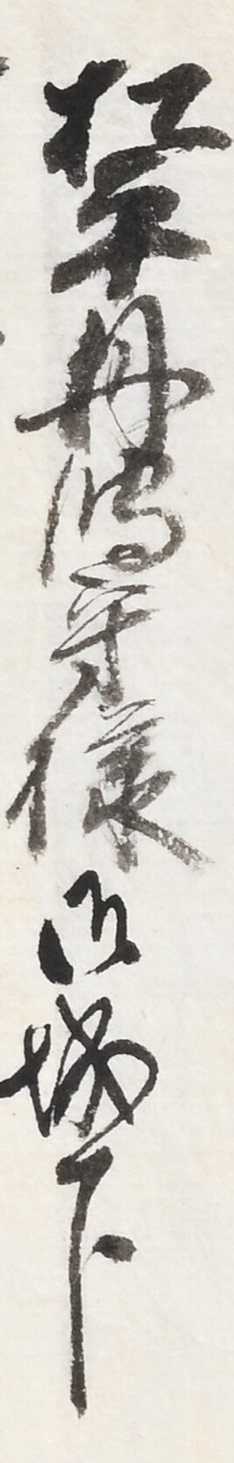松平丹波守様御城下
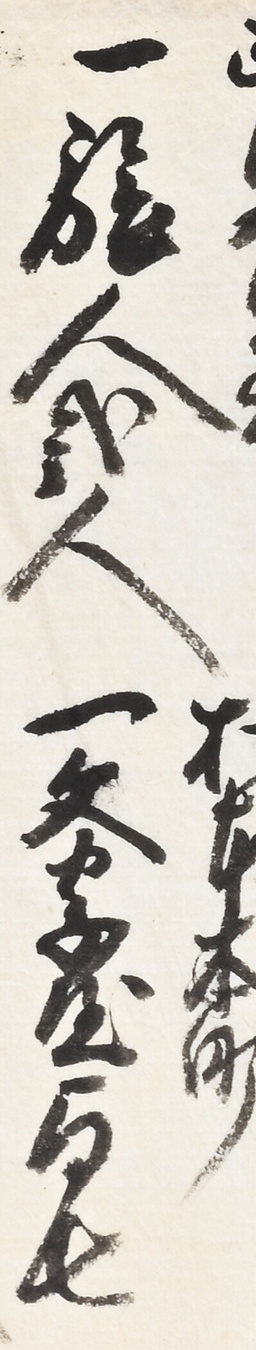一旅人弐人一文字屋与七
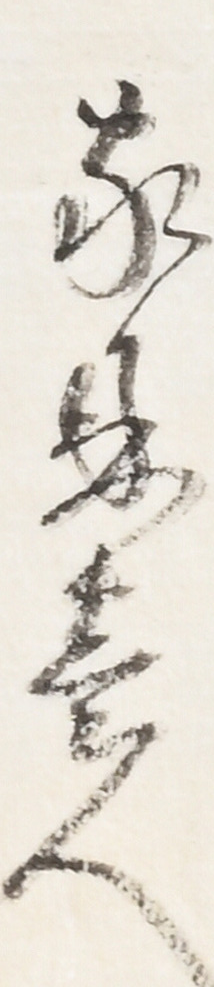家来壱人
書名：旅人泊控帳
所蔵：伊那市立高遠町図書館・合同会社AMANE
